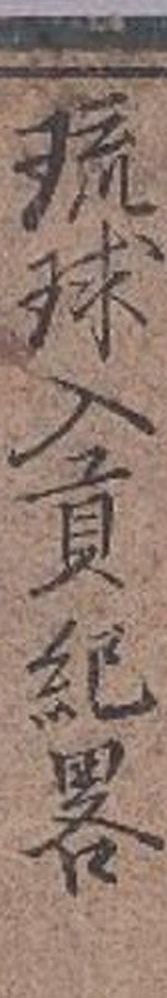琉球入貢紀畧完

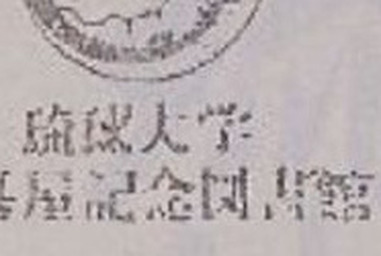琉球大学
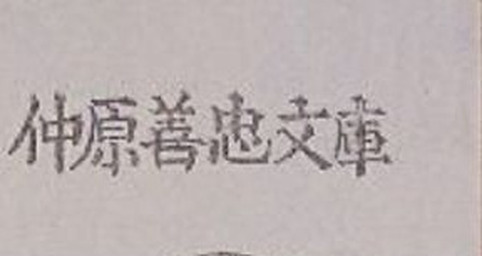「仲原善忠文庫
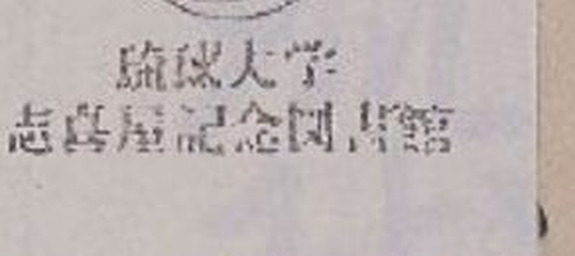志喜屋記念図書館」
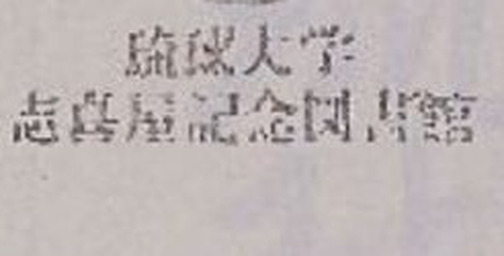志喜屋記念図書館」
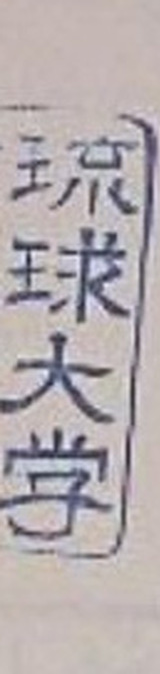琉球大学

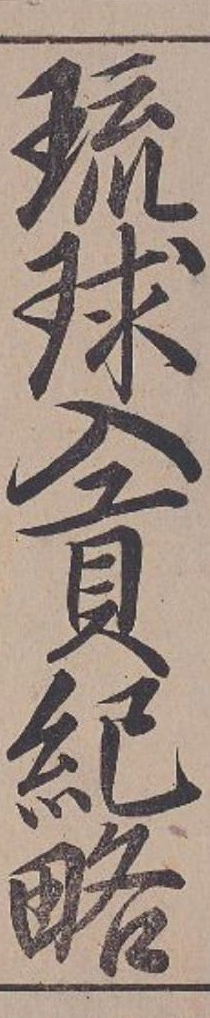琉球入貢紀略
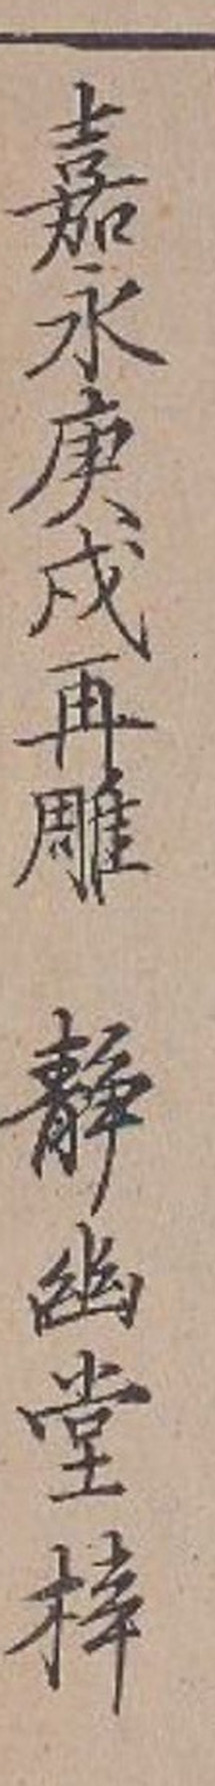嘉永庚戌再雕静幽堂梓
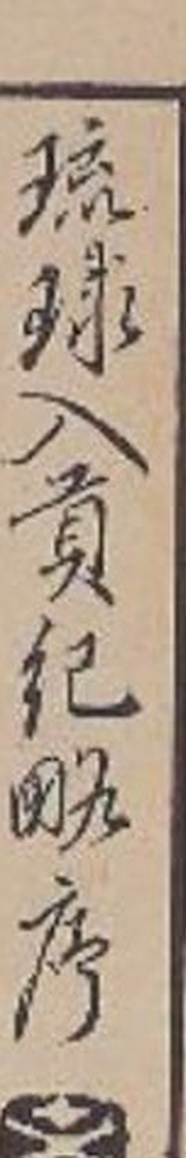琉球入貢紀略序
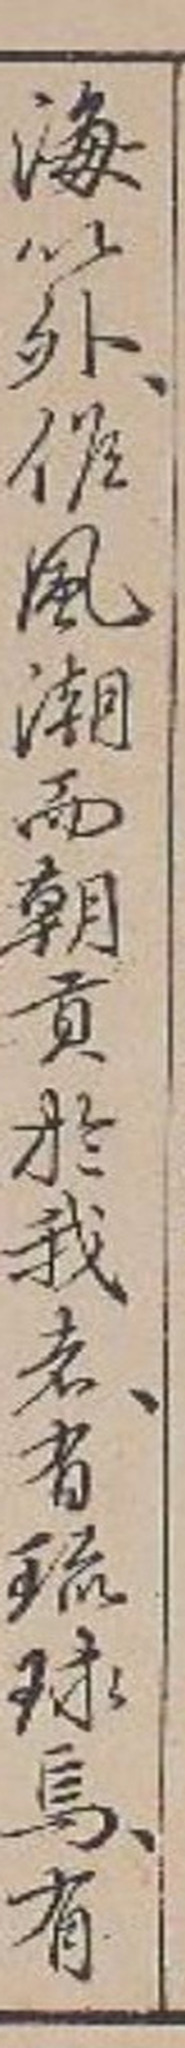海以外、作風潮而朝貢於我者、有琉球焉、有
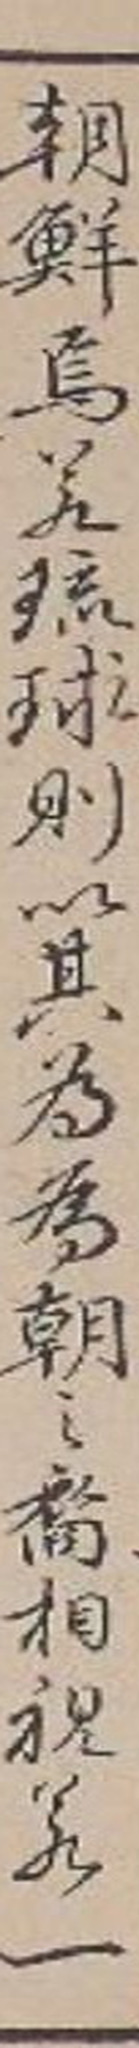朝鮮焉、若琉球、則以其為為朝之裔、相視若一
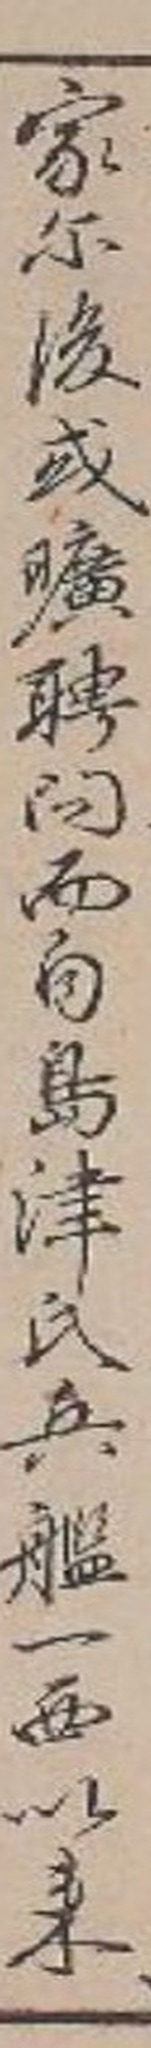家、尓後或曠聘問、而自島津氏兵艦一西以来、
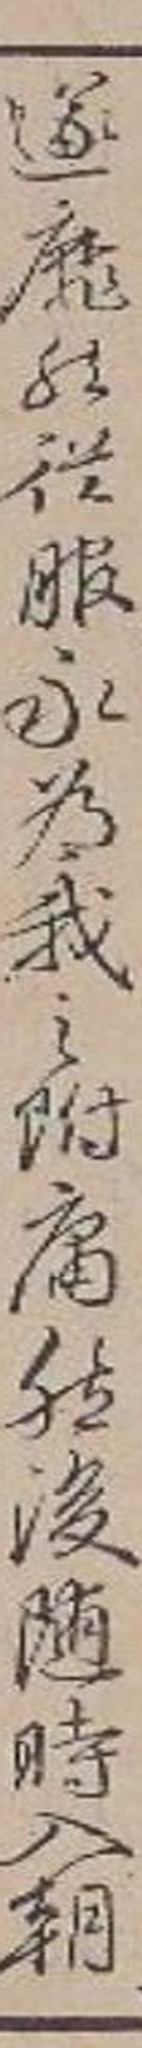遂靡然従服、永為我之附庸、然後随時入朝、
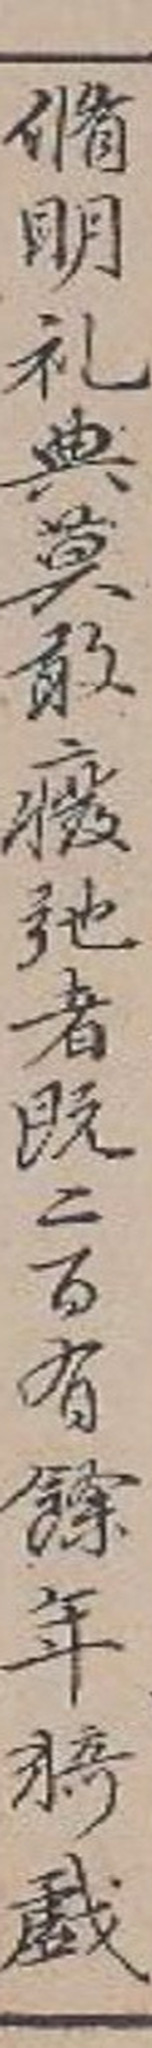脩明礼典、莫敢癈弛者、既二百有余年、猗戯
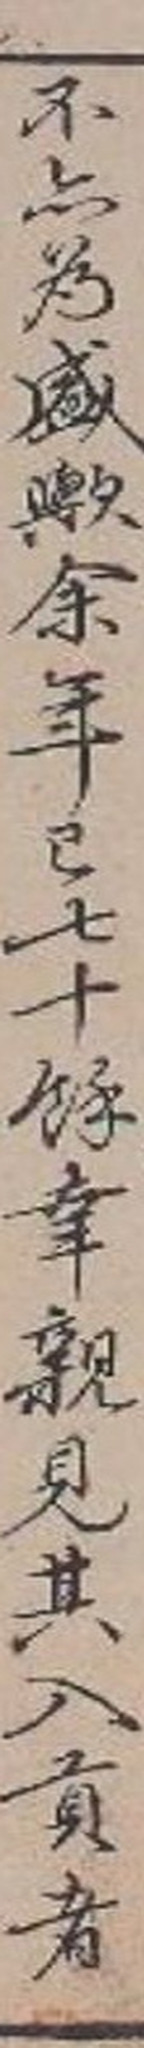不亦為盛歟、余年已七十余、幸親見其入貢者
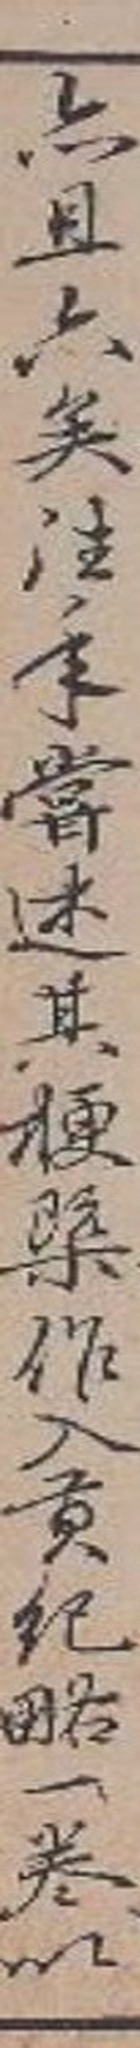亦且亦矣、往年嘗述其梗概、作入貢紀略一巻、以
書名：琉球入貢紀略
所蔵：University of the Ryukyus Library
